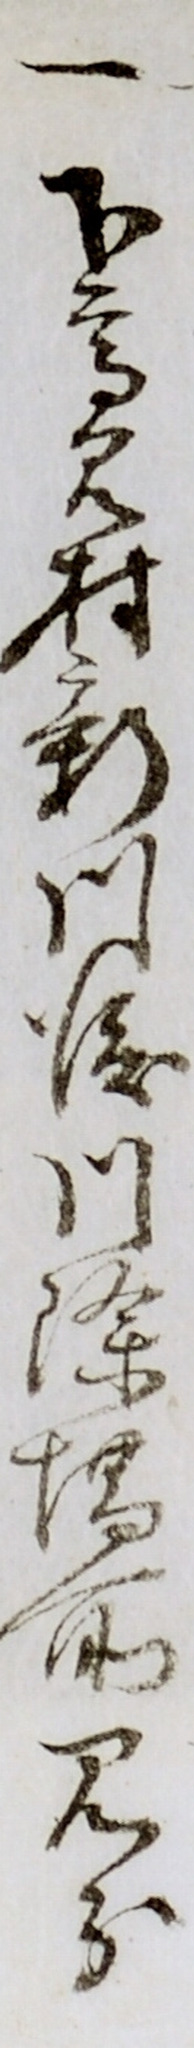一下高見村新川渡川除場所見分
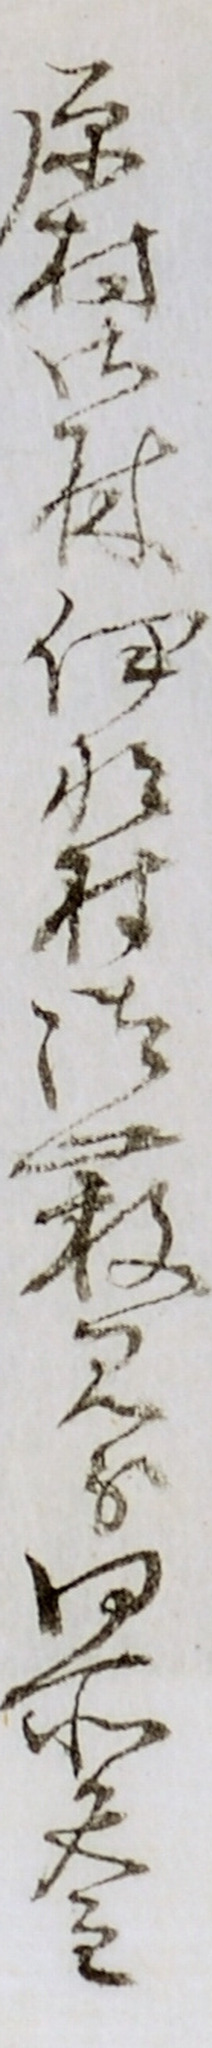原村御林伊那村御薮見分同所名主
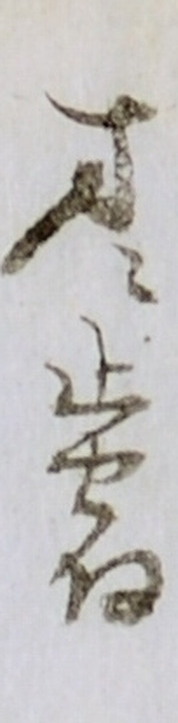方に止宿
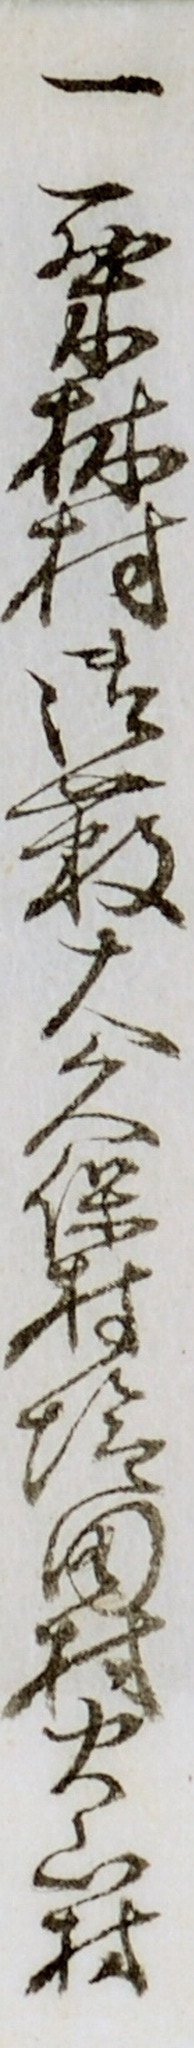一栗林村御薮大久保村塩田村火山村
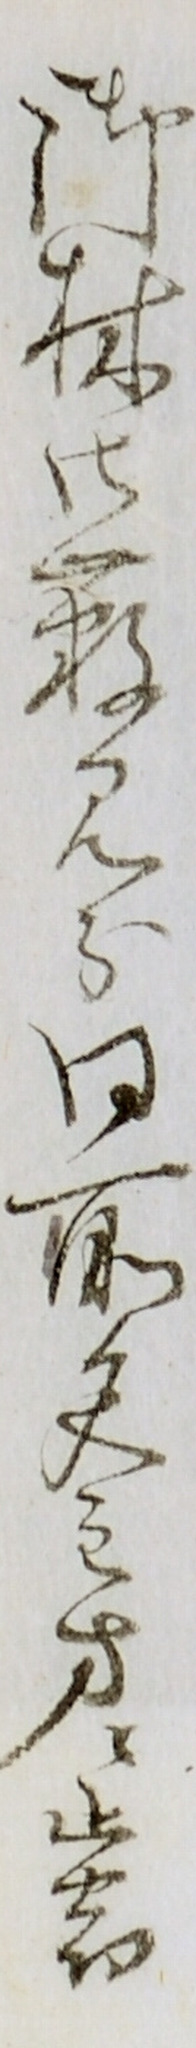御林御薮見分同所名主方に止宿
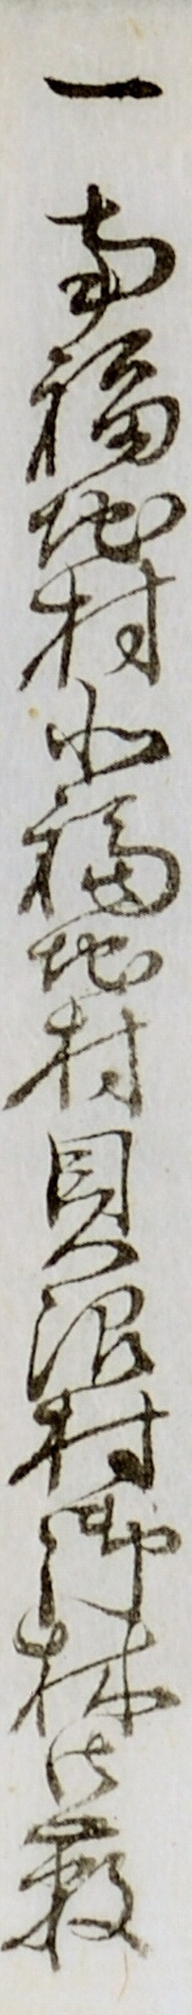一南福地村北福地村貝沼村御林御薮
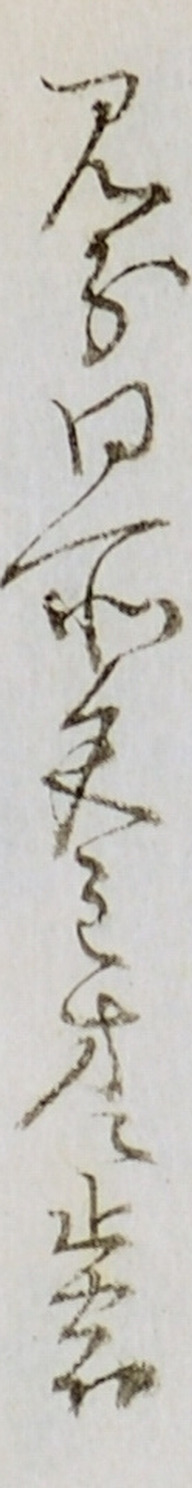見分同所名主方に止宿
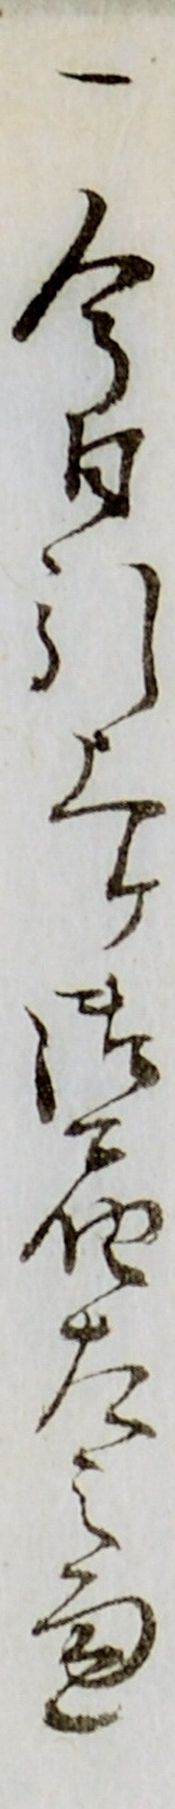一今日引上ケ御届左之通
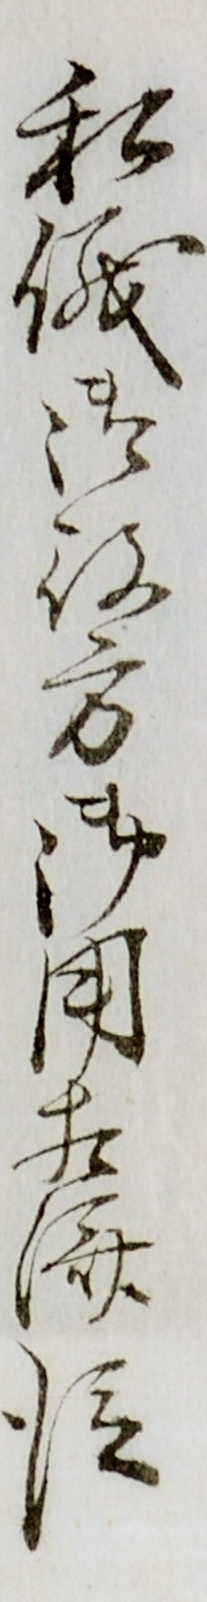私儀御役方御用相済従
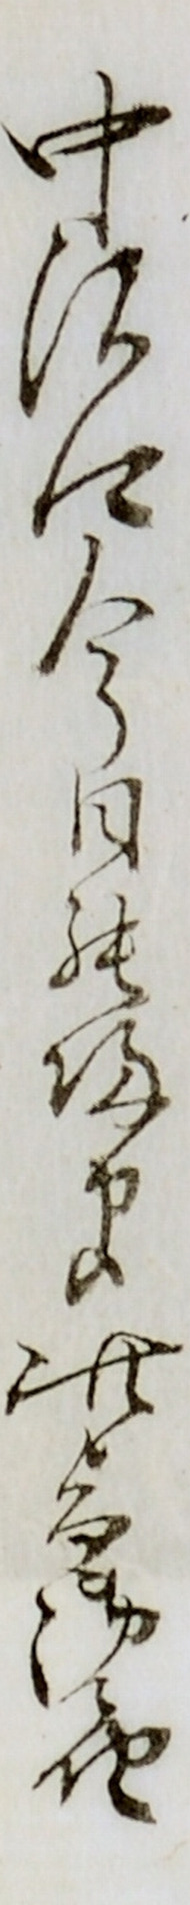中沢郷今日罷帰申候此旨御届
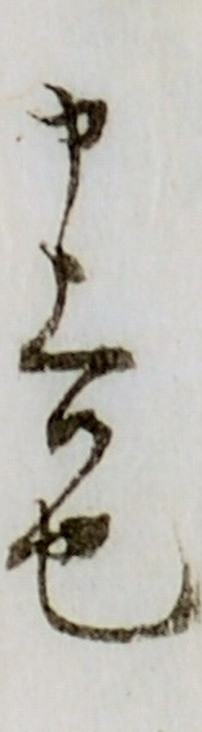申上候也
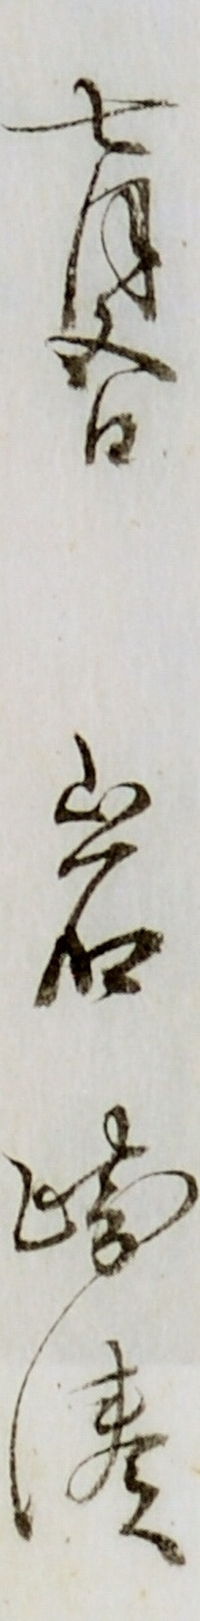七月五日岩崎湊
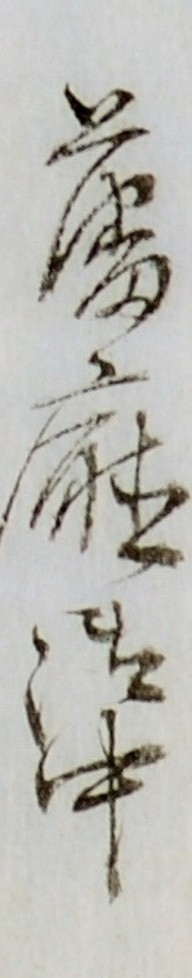藩庁御中
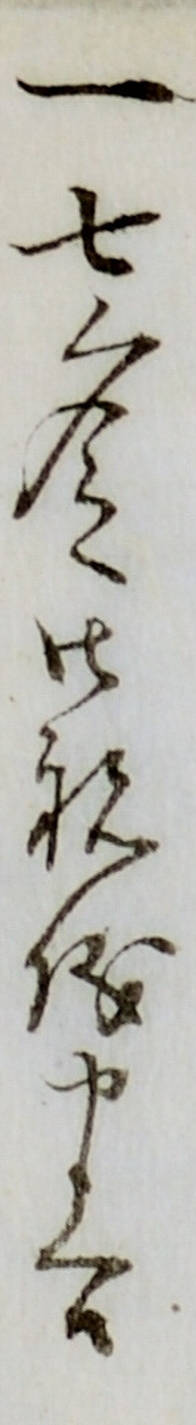一七夕之御祝儀申上候
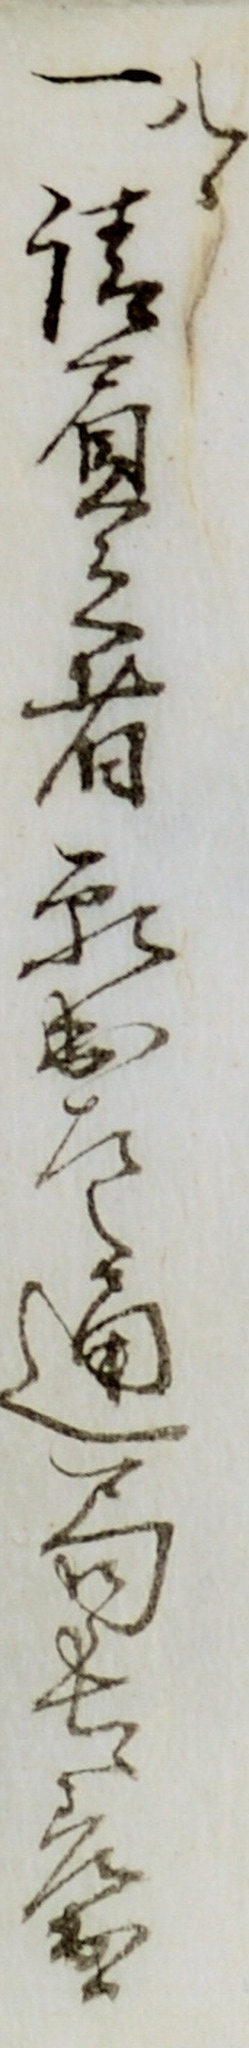一請負之者願出左之通局長へ差出候

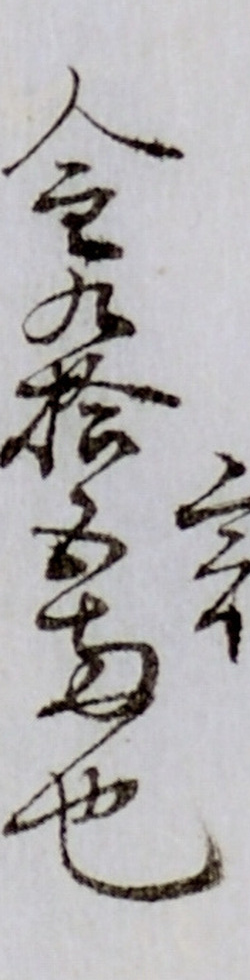金九拾五両也
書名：山林方諸事御用留
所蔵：伊那市立高遠町図書館・合同会社AMANE
